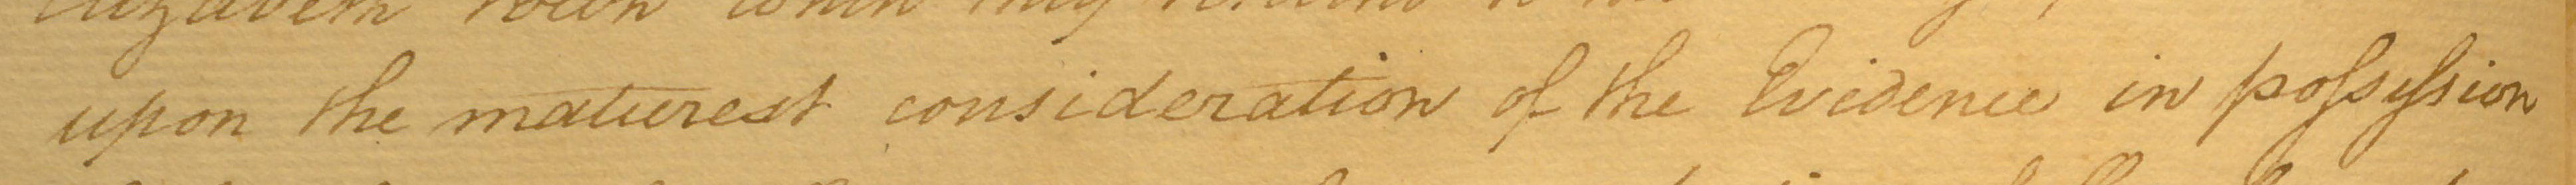upon the maturest consideration of the Evidence in possession
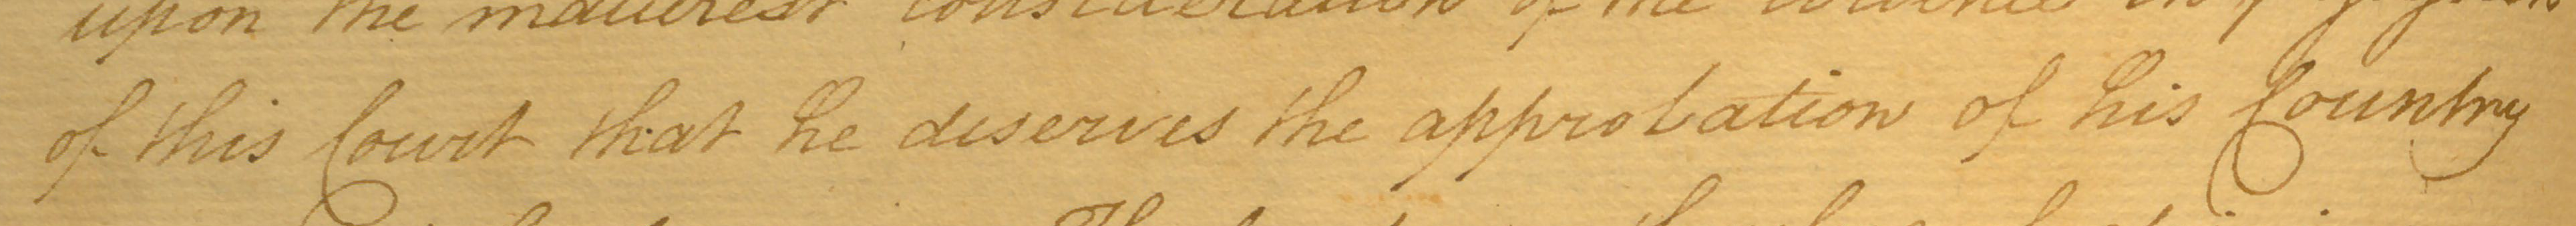of this Court that he deserves the approbation of his Country
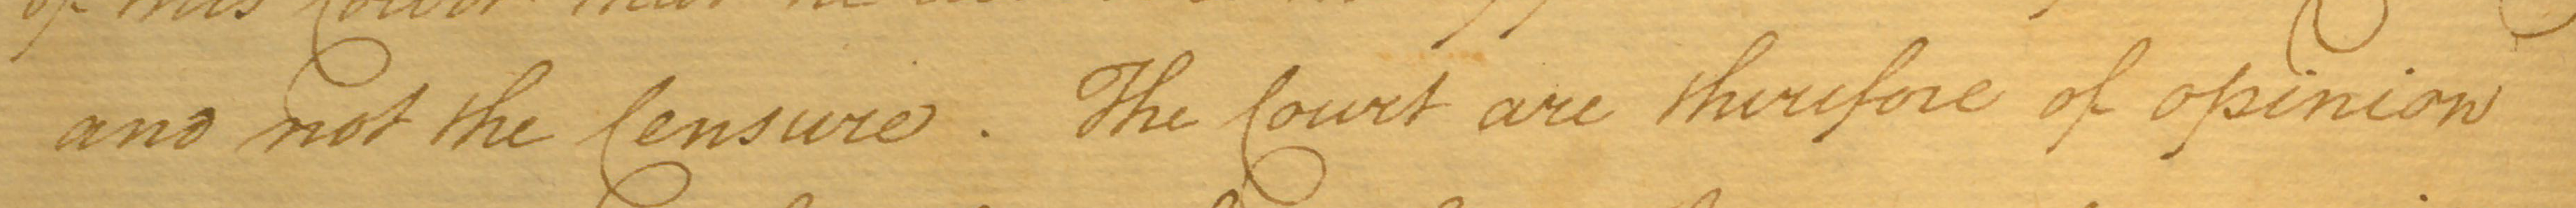and not the Censure. The Court are therefore of opinion
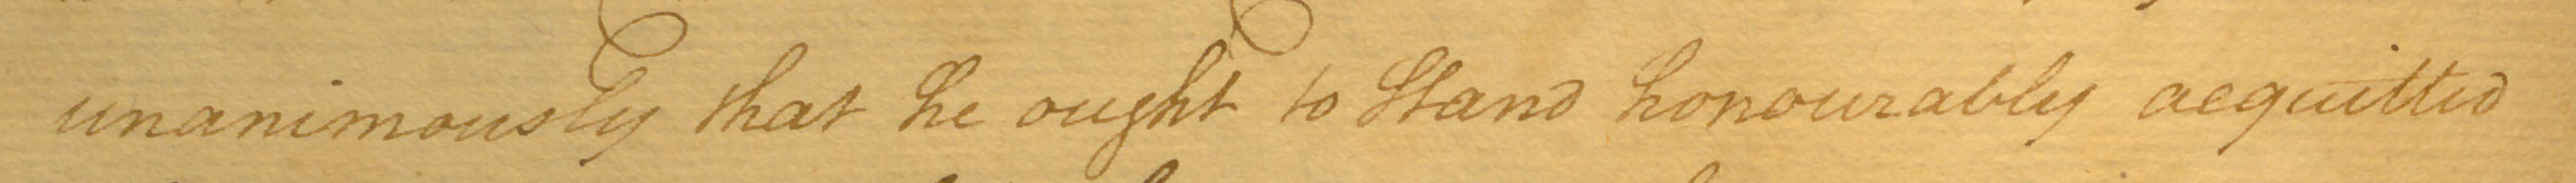unanimously that he ought to stand honourably acquitted
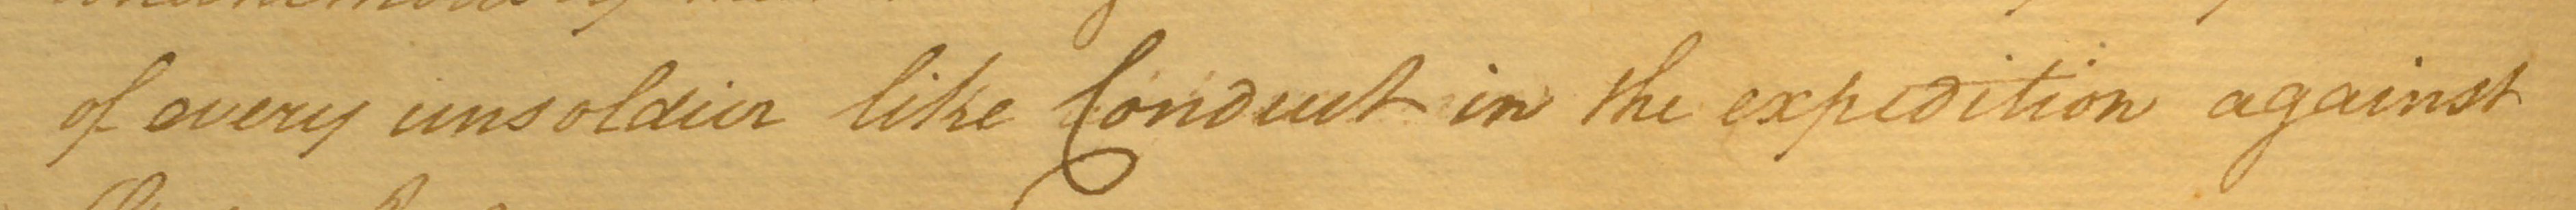of every unsoldier like Conduct in the expedition against
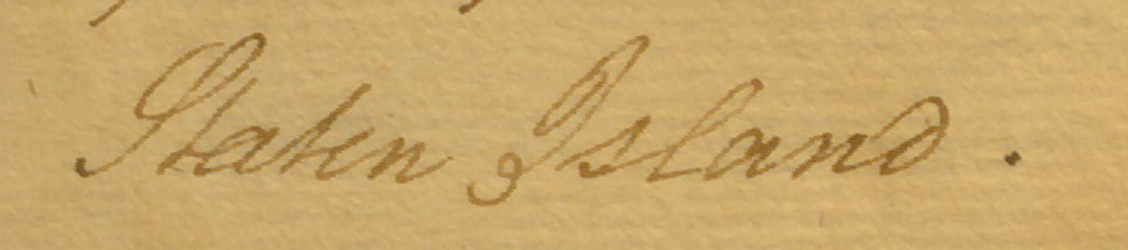Staten Island.
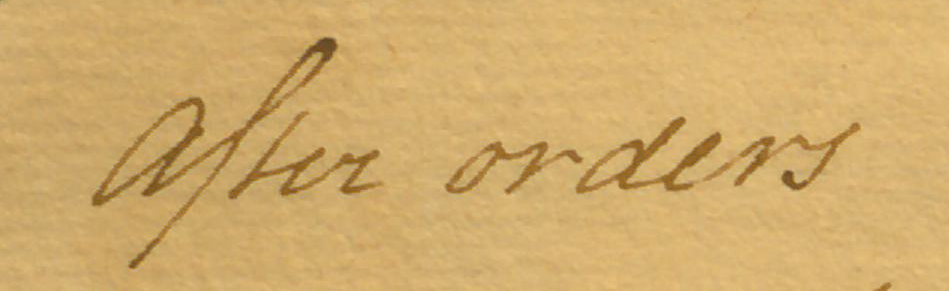after orders
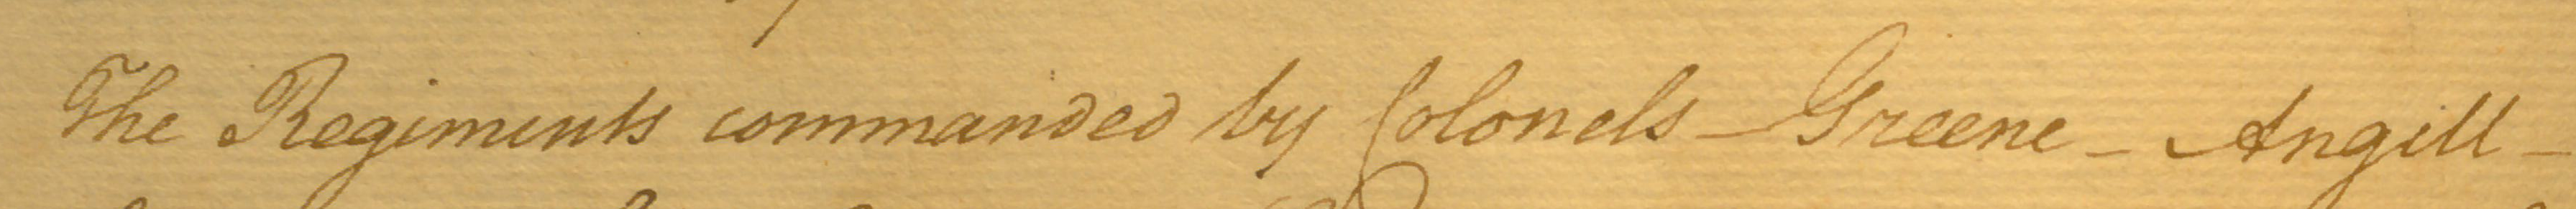The Regiments commanded by Colonels Greene- Angill-
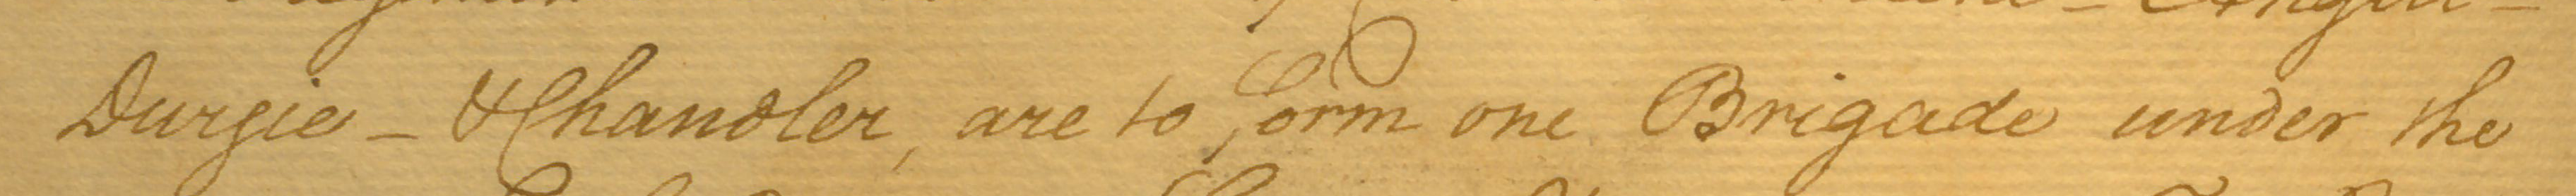Durgie- & Chandler are to form one Brigade under the
